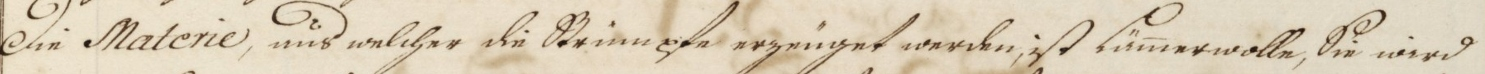Die Materie, aus welcher die Strümpfe erzeüget werden, ist Lämmerwolle, Sie wird
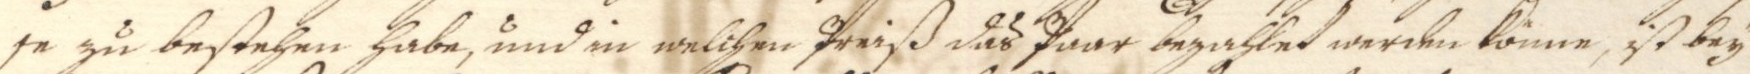se zu bestehen habe, und in welchen Preiß das Paar bezahlet werden könne, ist bey
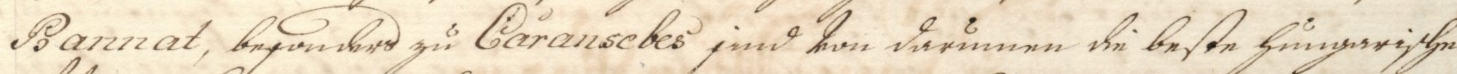Bannat, besonders zu Caransebes sind von darumen die beste hungarische
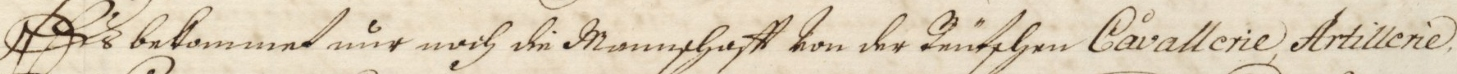Es bekommet nur noch die Mannschafft von der Teütschen Cavallerie, Artillerie
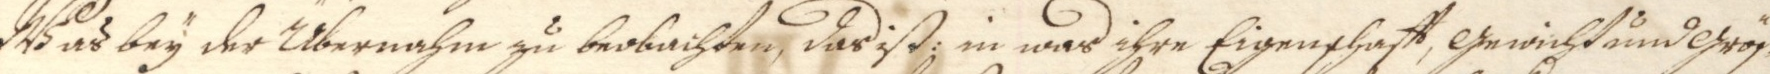Was bey der Übernahm zu beobachten, das ist: in was ihre Eigenschafft, Gewicht und Grös
